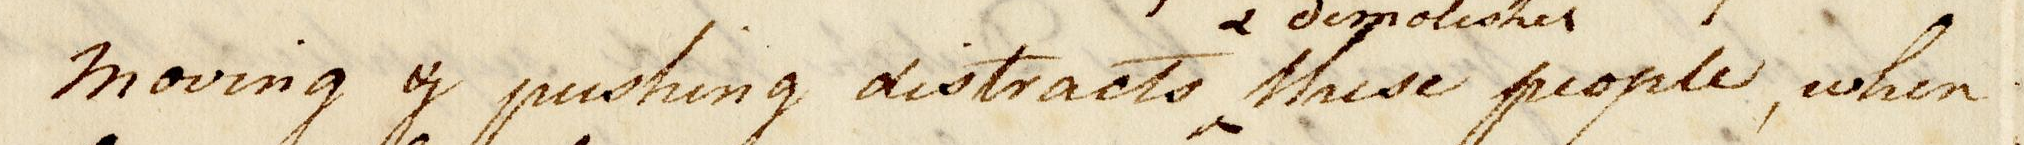Moving & pushing distracts ^ these people, when
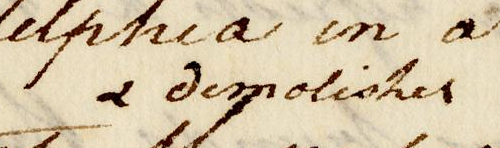& demolishes
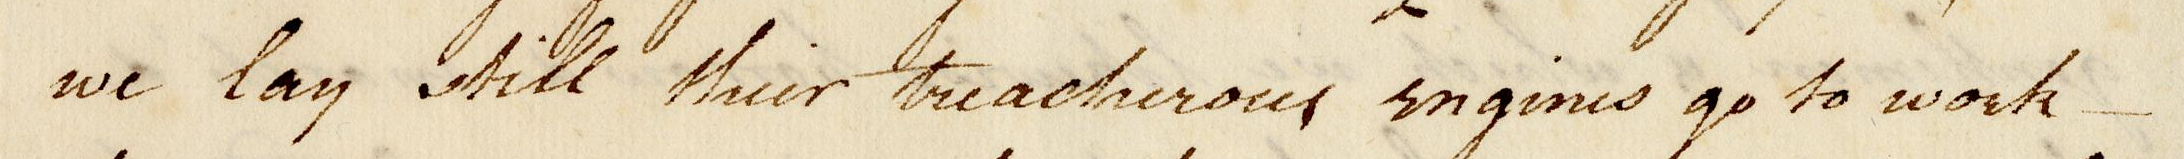we lay still their treacherous engines go to work-
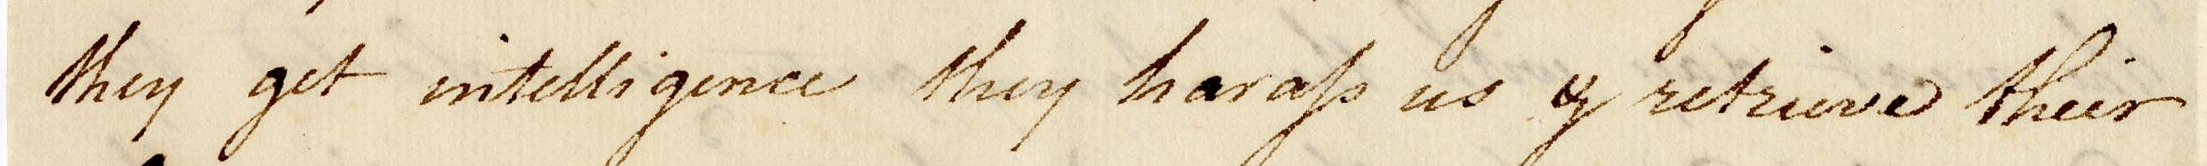they get intelligence they harass us & retrieve their
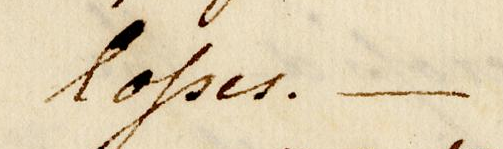losses.-
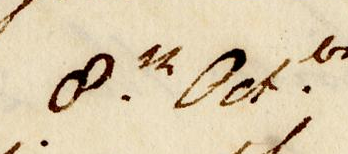8^th. Oct^br.
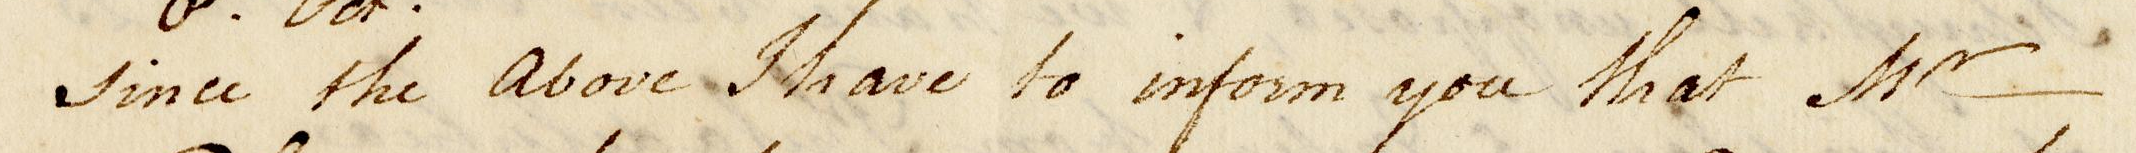since the Above I have to inform you that M^r
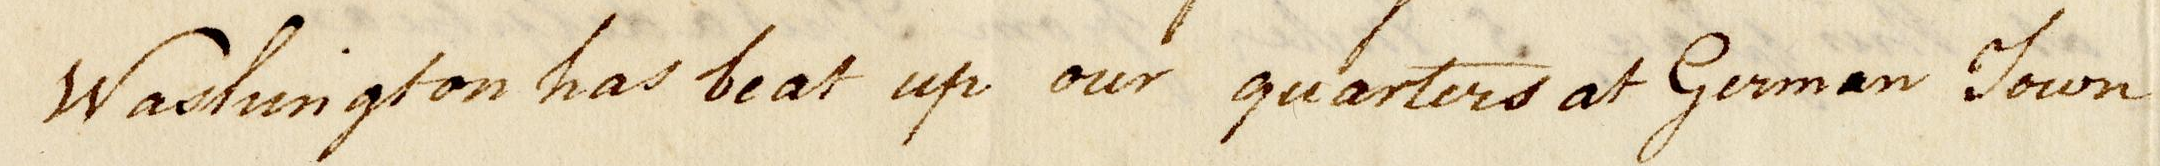Washington has beat up our quarters at German Town
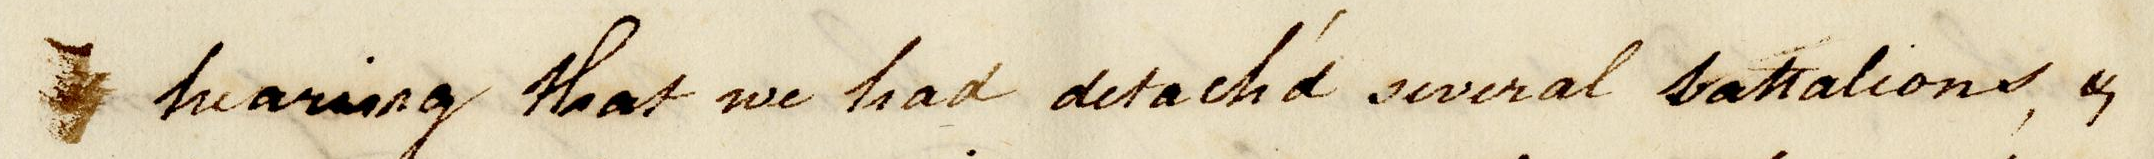[_] hearing that we had detach'd several battalions, &
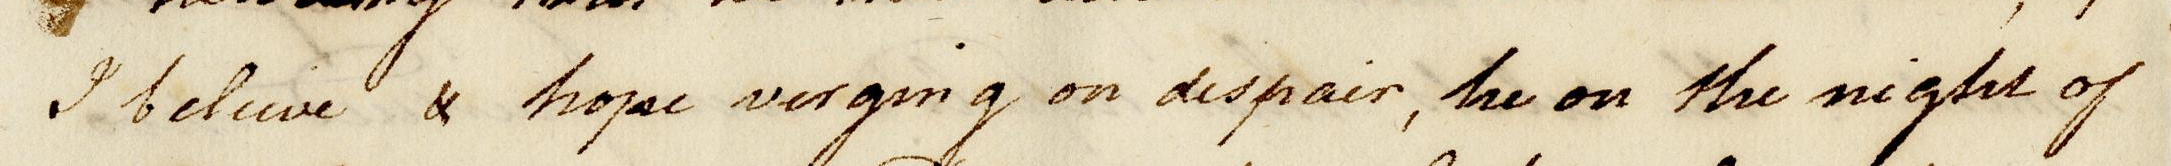I believe & hope verging on despair, he on the night of
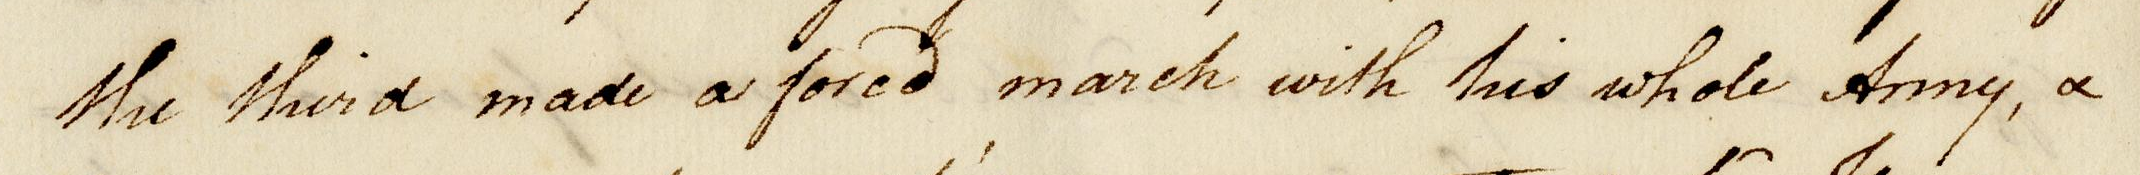the third made a forcd march with his whole Army, &
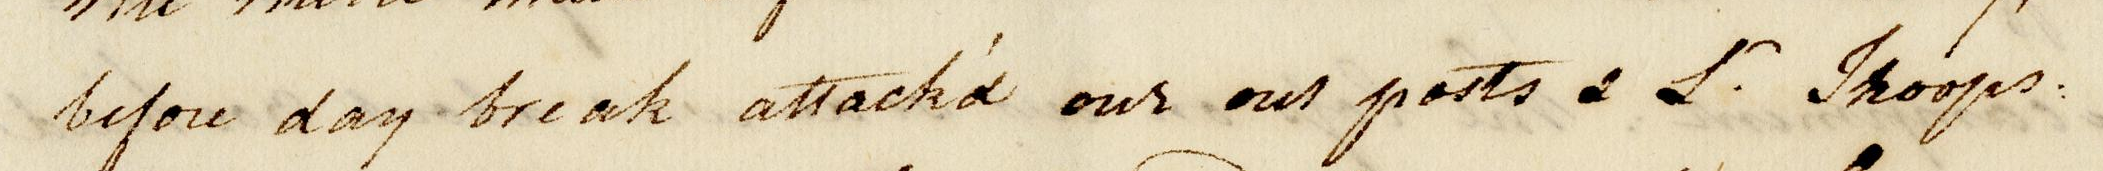before day break attack'd our out posts & L^t. Troops:
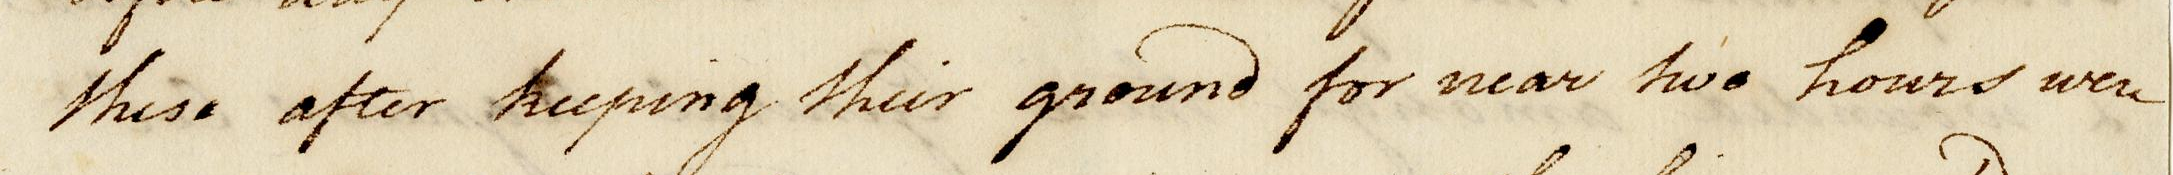these after keeping their ground for near two hours were
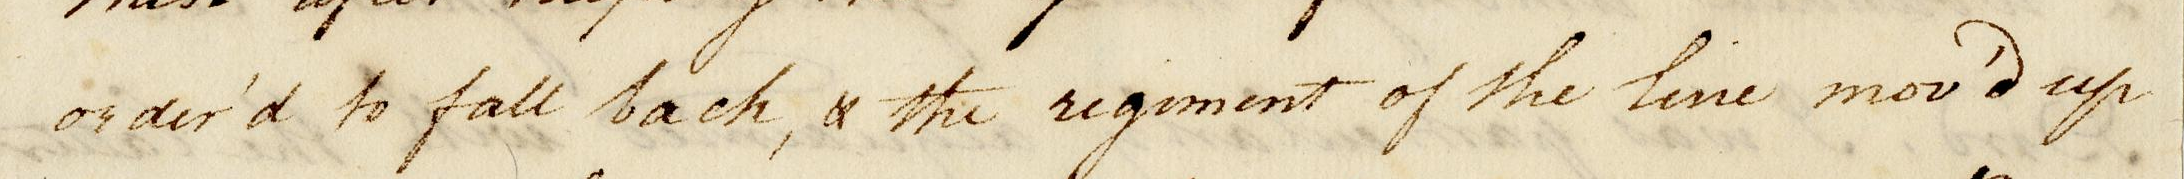order'd to fall back, & the regiment of the line mov'd up
